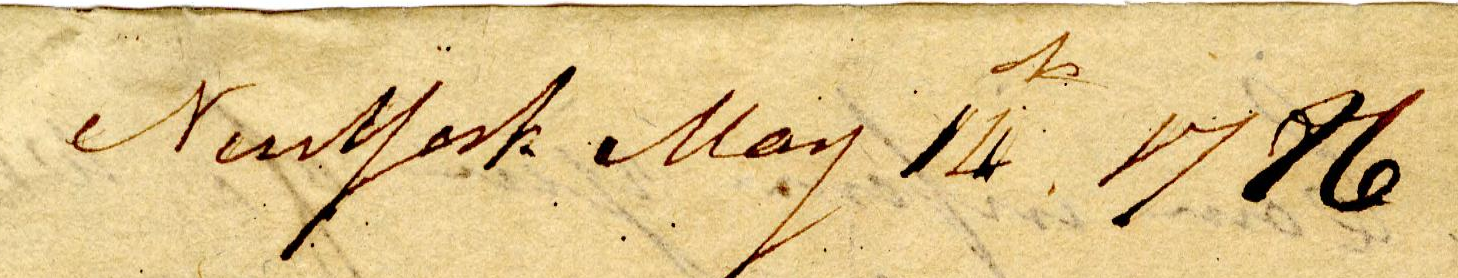New York May 14^th 1786
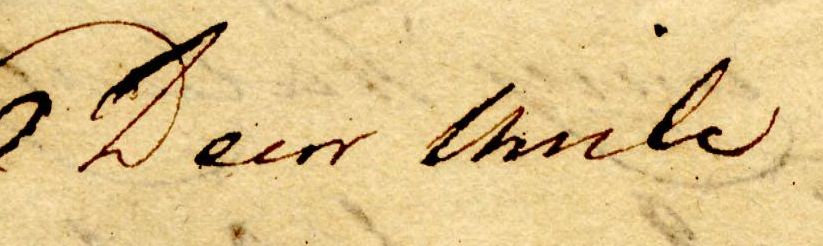Dear Uncle
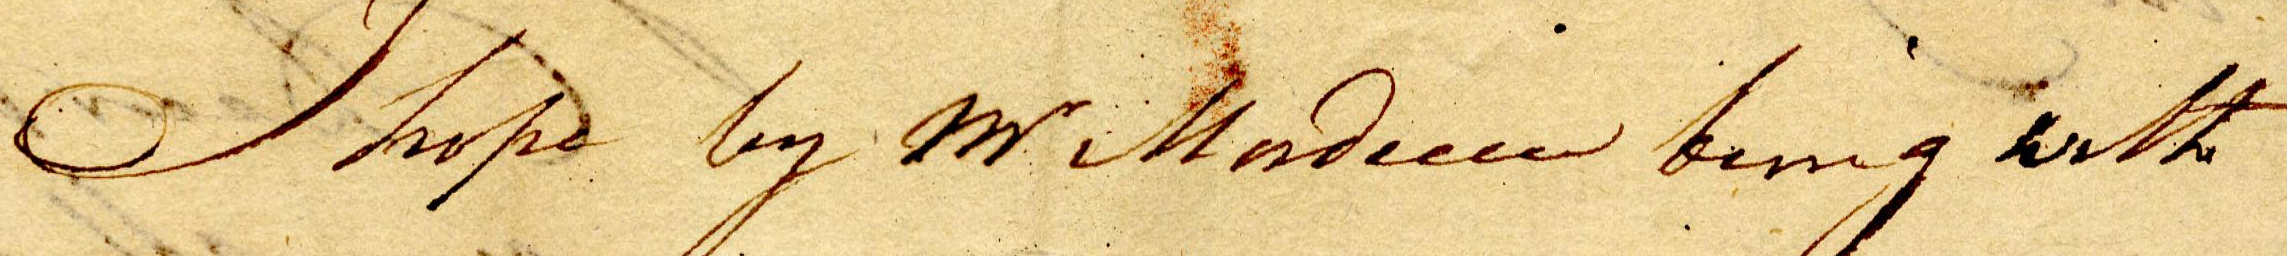I hop'd by M^r. Mordecai being with
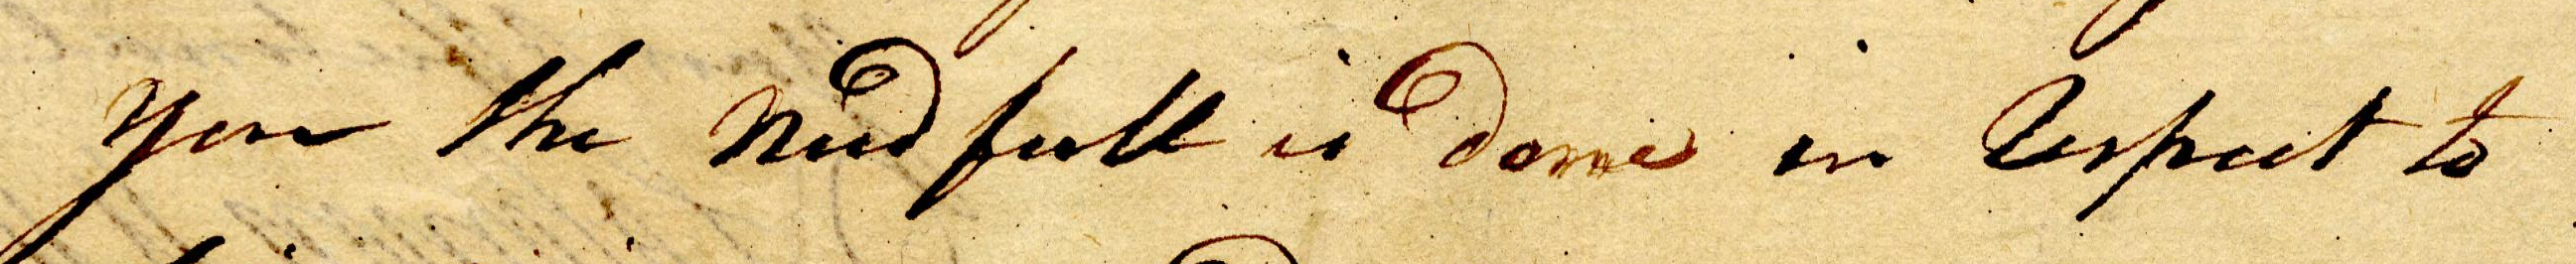you the needfull is done in respect to
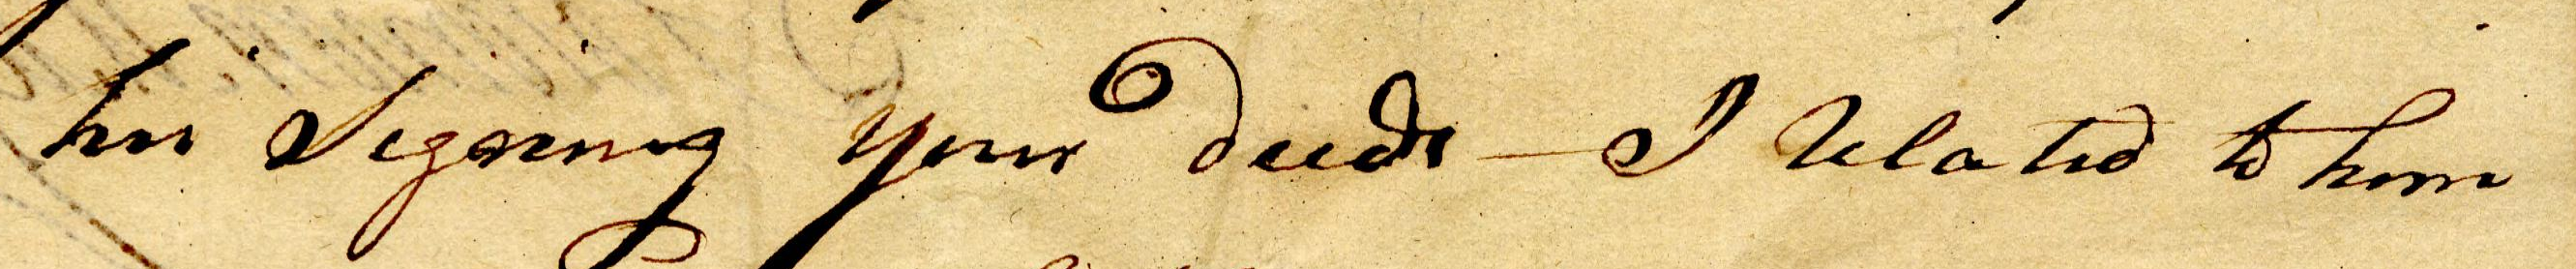his Signing Your deeds- I related to him
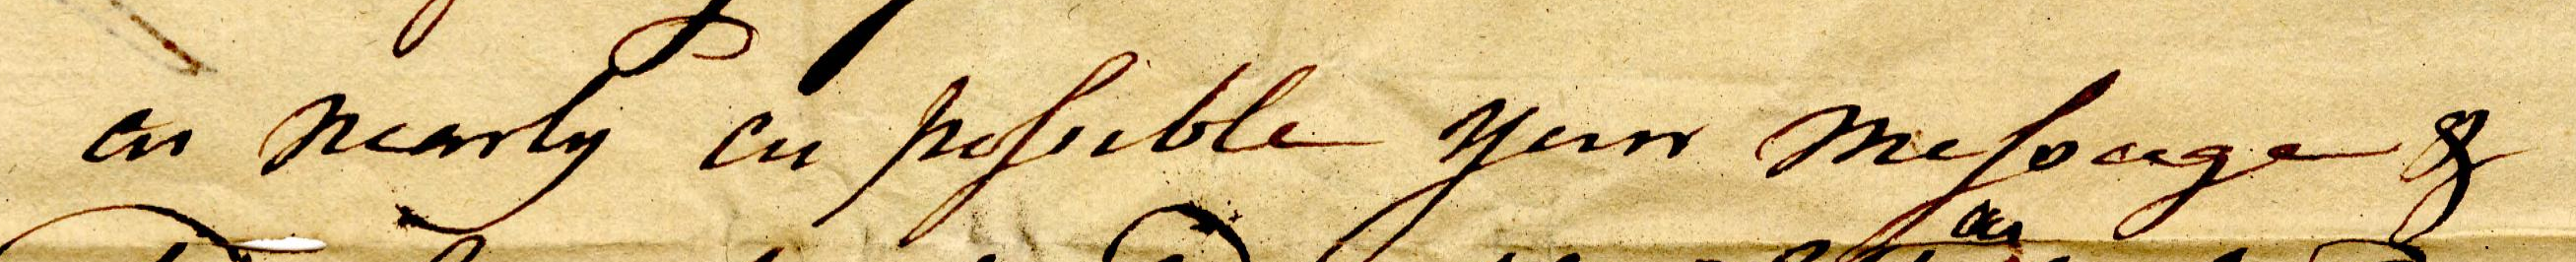as nearly as possible your message &
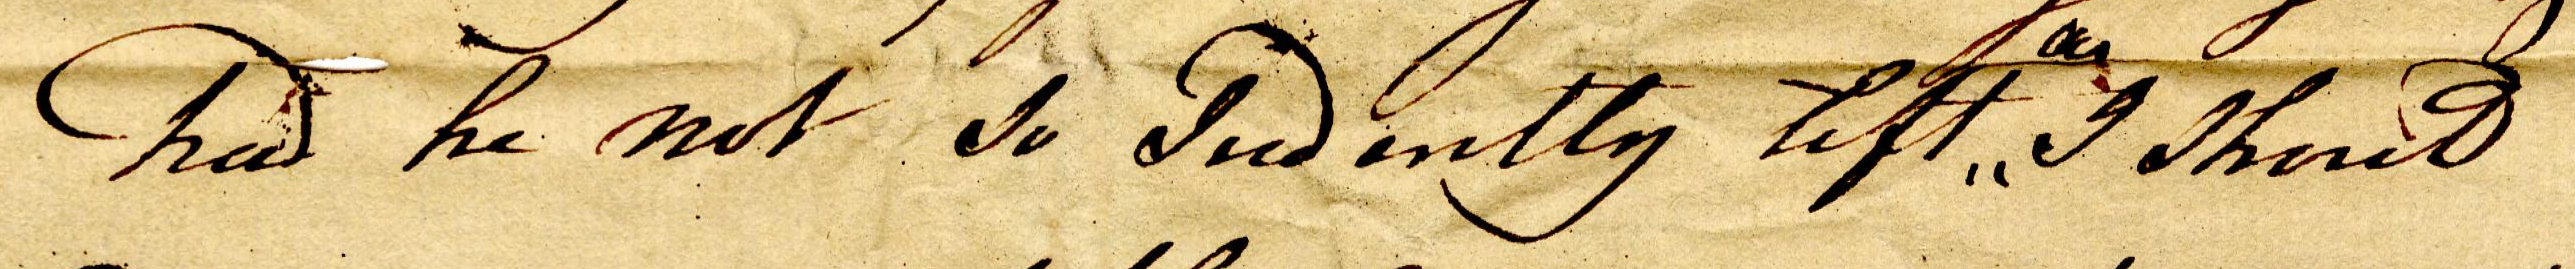had he not so sudently left I should
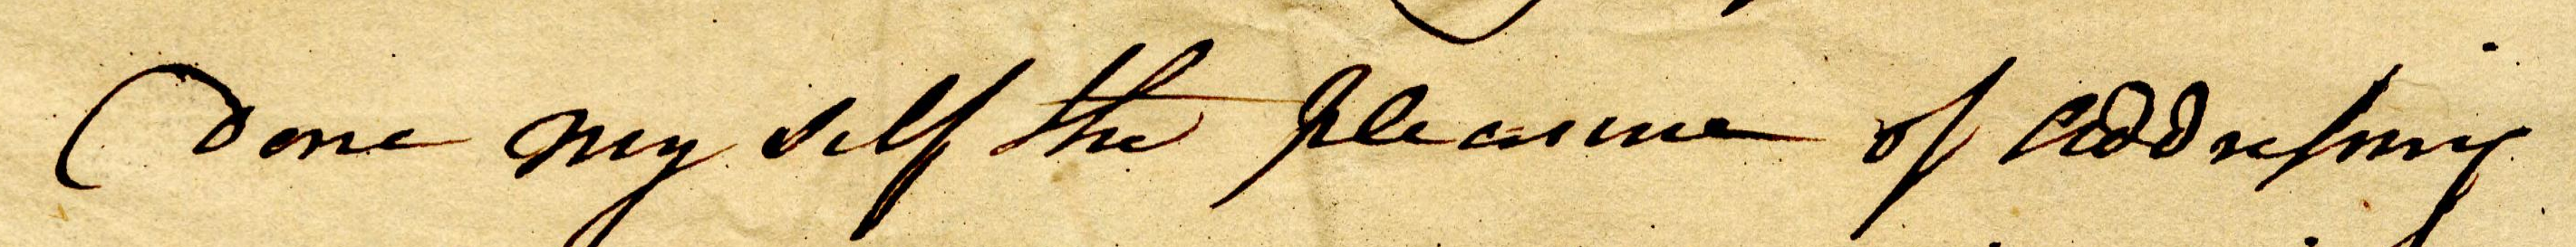done myself the pleasure of addressing
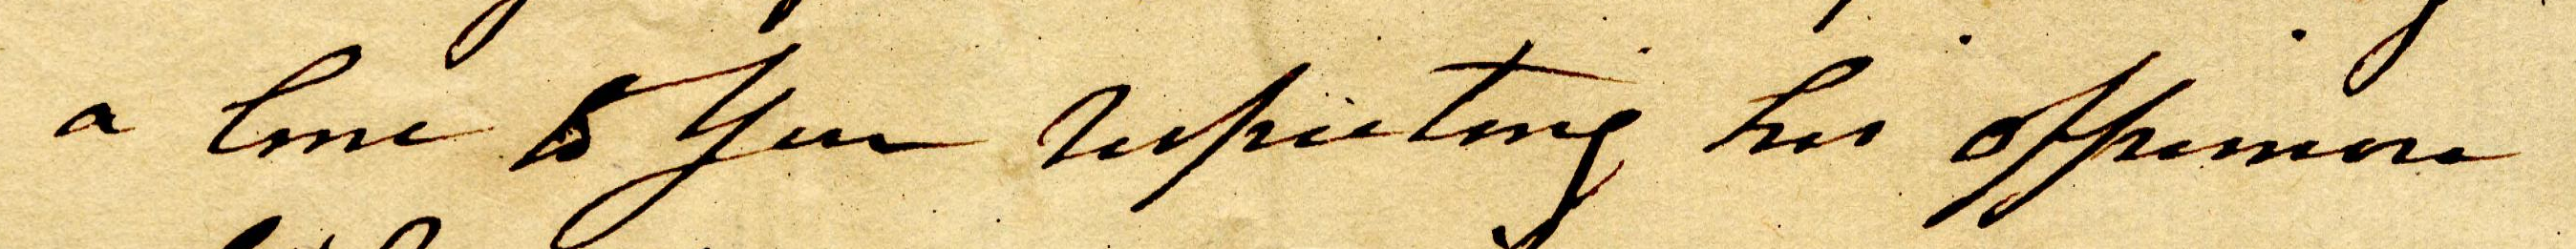a line to you respecting his opinions
